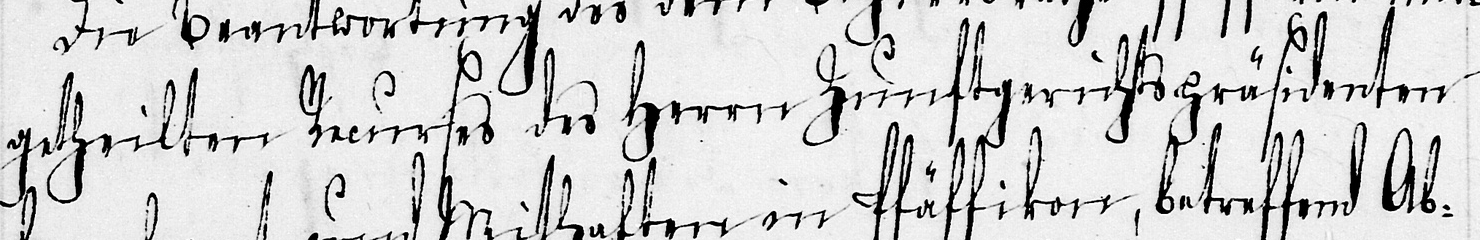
getheilten Recurses des Herrn Zunftgerichtspräsidenten
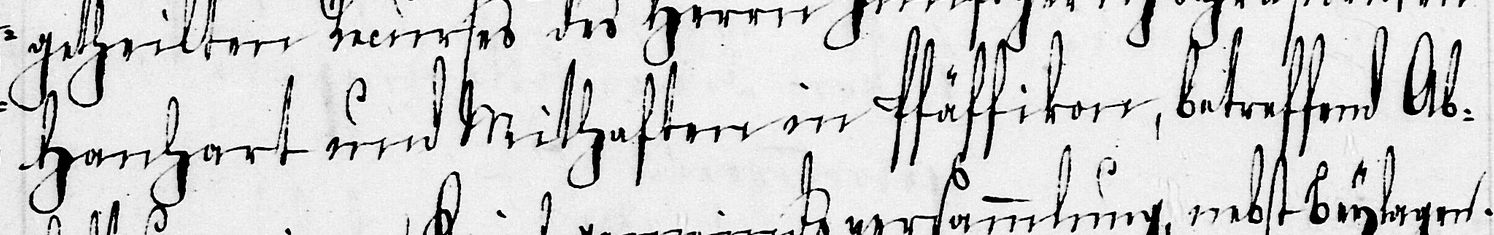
Hanhart und Mithaften in Pfäffikon, betreffend A¬
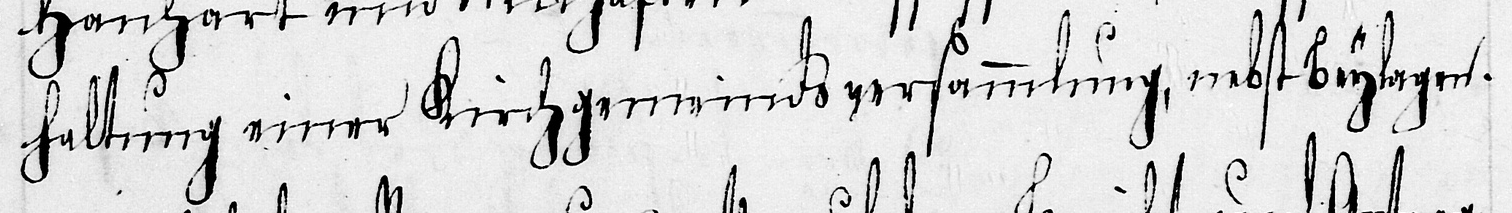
bhaltung einer Kirchgemeindsversammlung, nebst Beylagen.
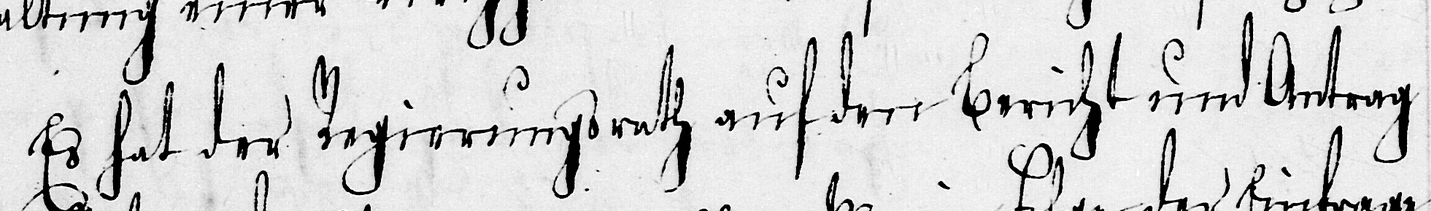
Es hat der Regierungsrath auf den Bericht und Antrag
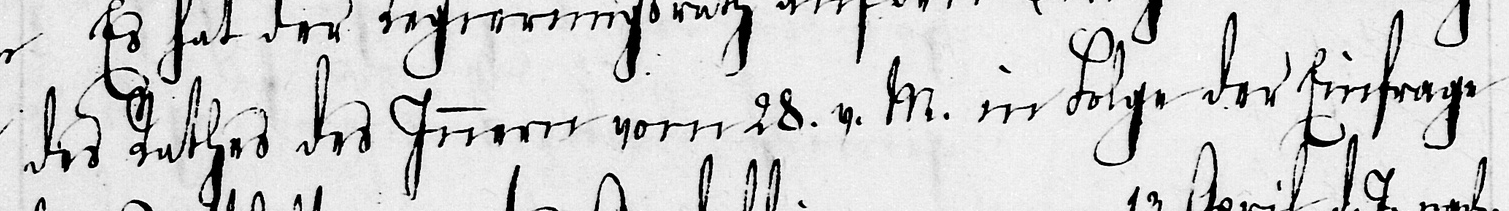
des Rathes des Innern vom 28. v. M. in Folge der Einfrage
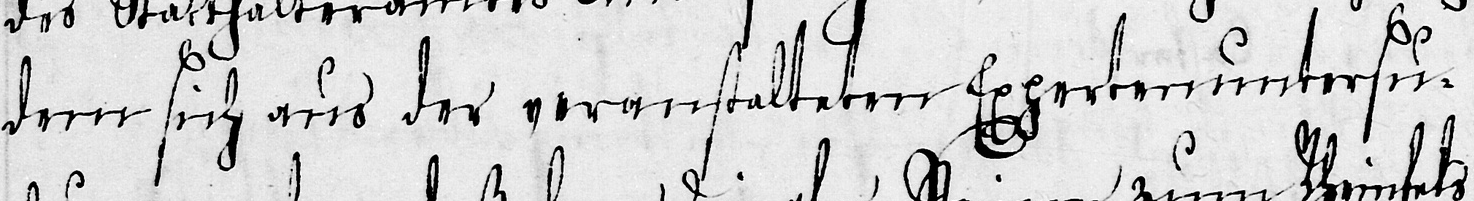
dem sich aus der veranstalteten Expertenuntersu¬
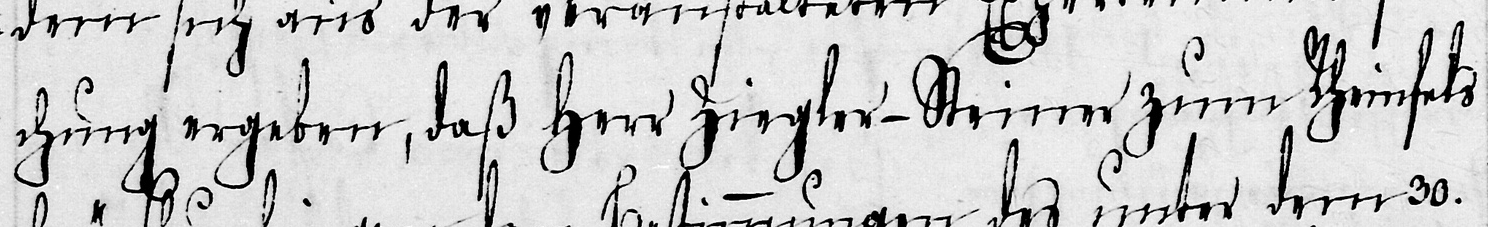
chung ergeben, daß Herr Ziegler-Steiner zum Rheinfels
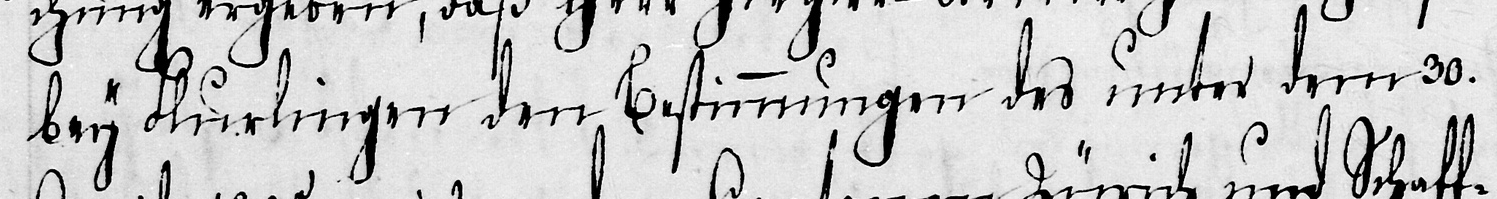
bey Flurlingen den Bestimmungen des unter dem 30.
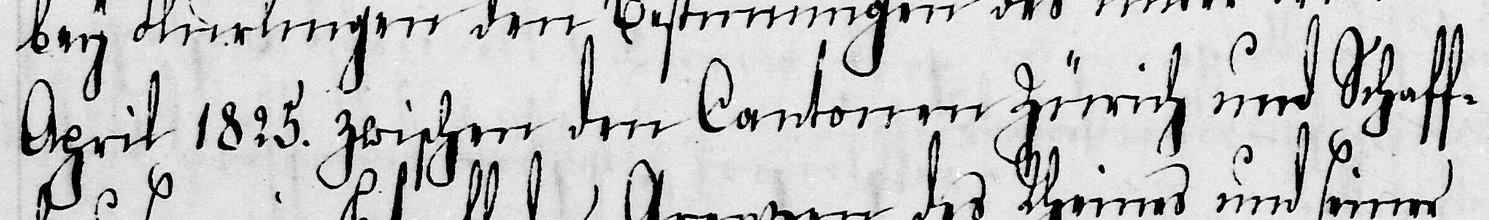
April 1825. zwischen den Cantonen Zürich und Schaf¬
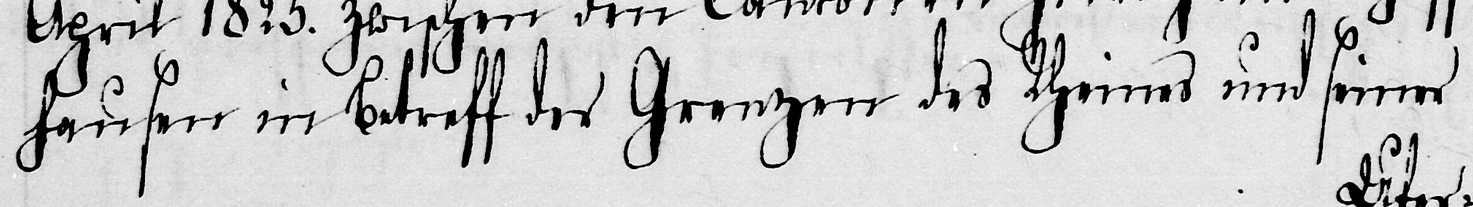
fhausen in Betreff der Grenzen des Rheines und seiner
